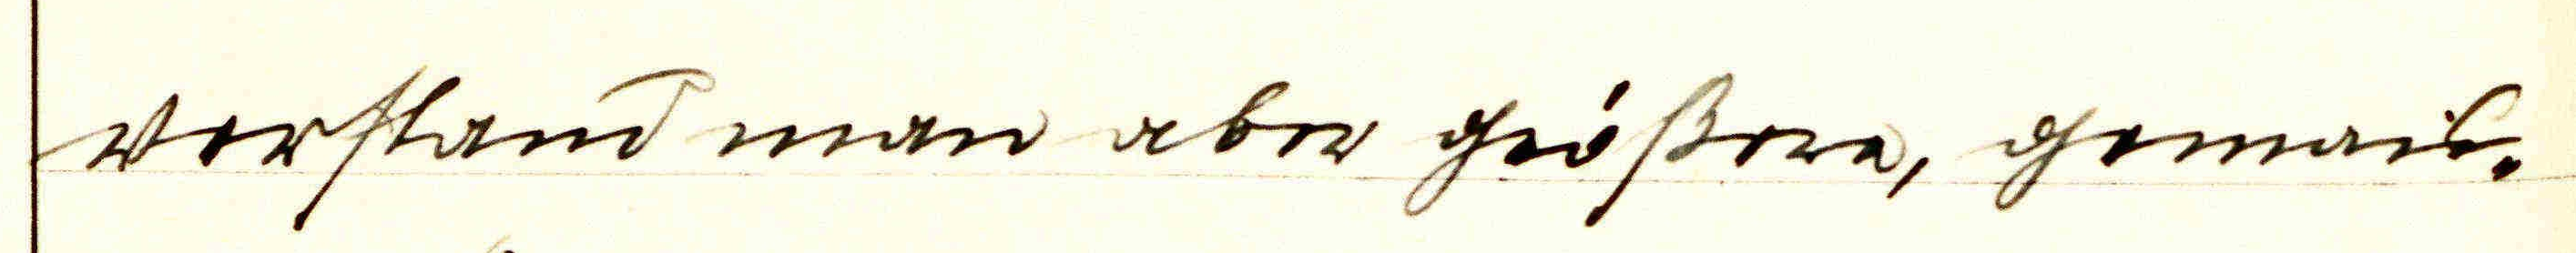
verstand man aber größere, gemau-
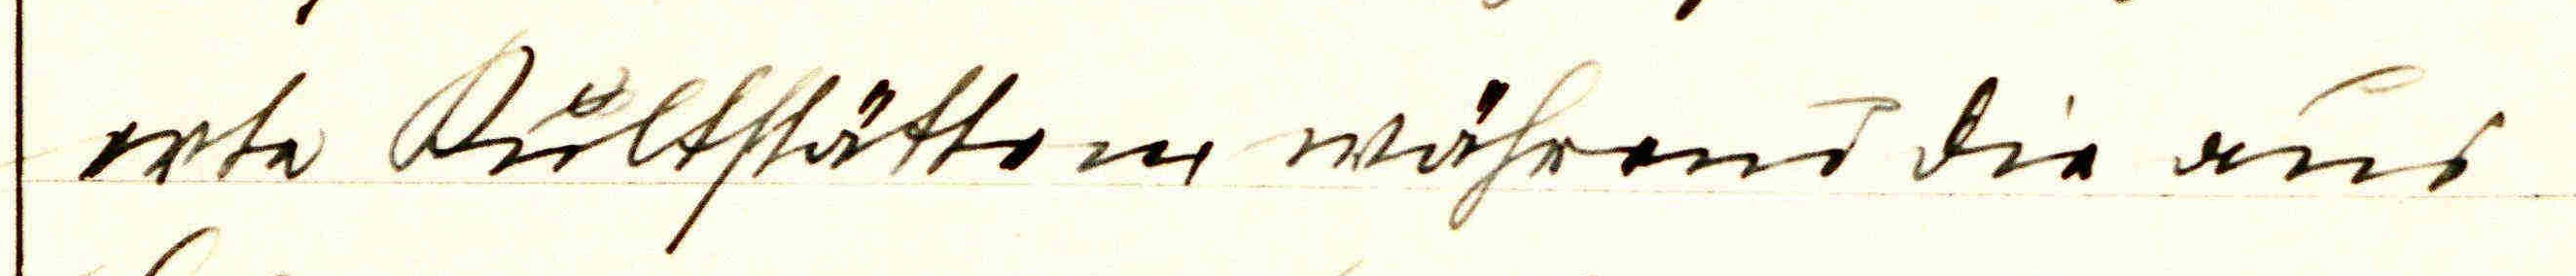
erte Kultstätten während die aus
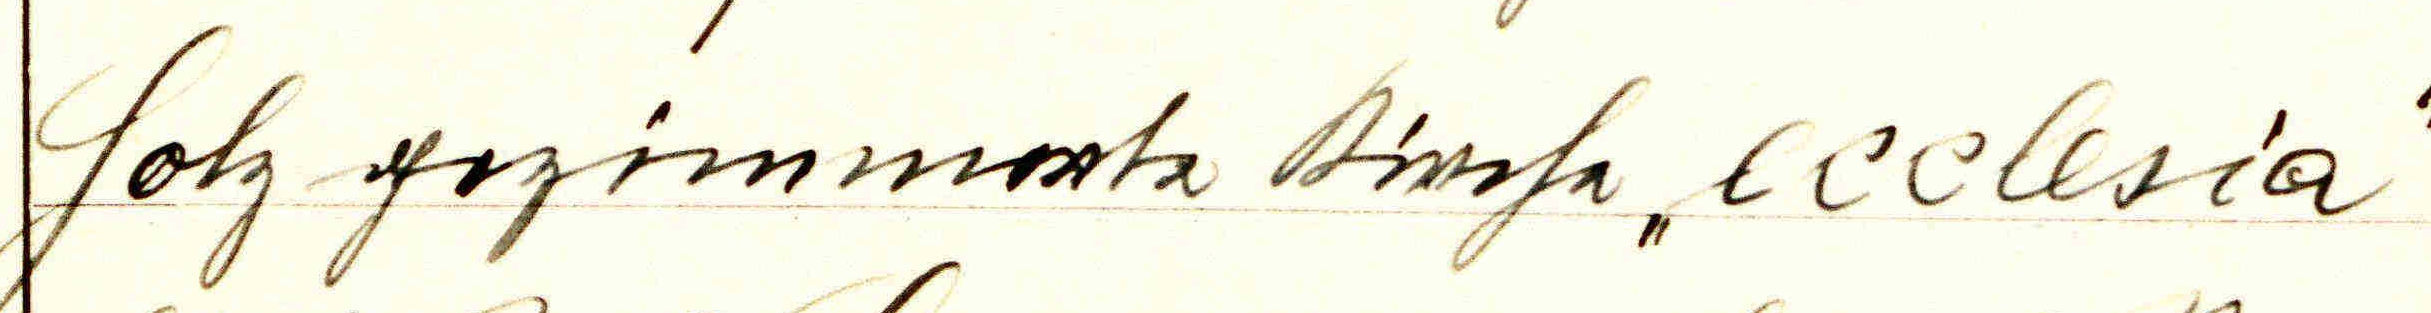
Holz gezimmerte Kirche „ecclesia“
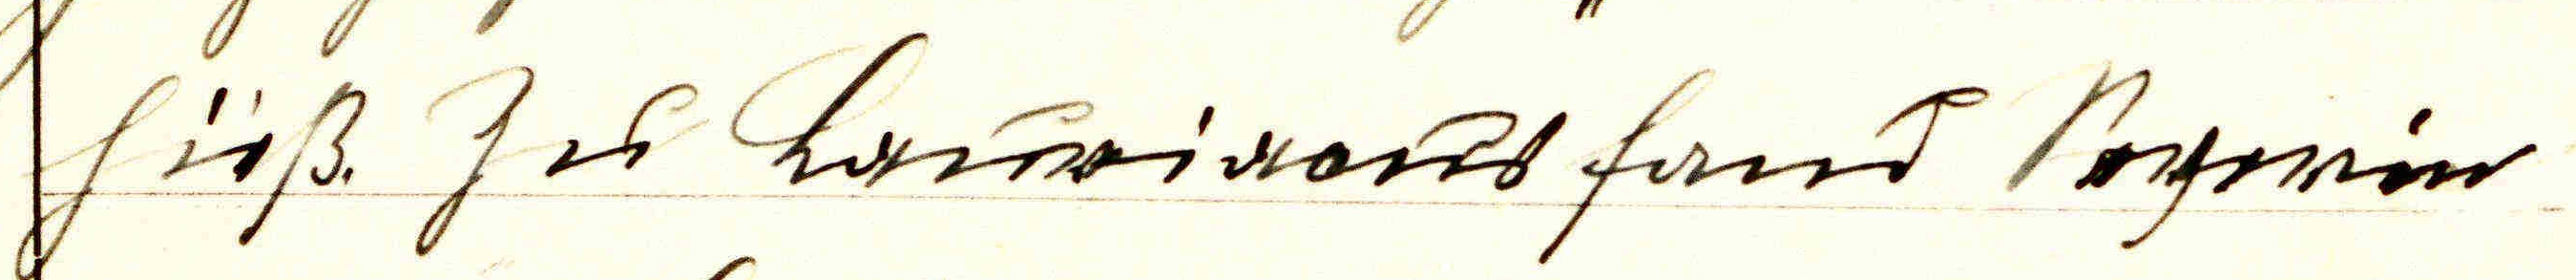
hieß. Zu Lauriacus fand Severin
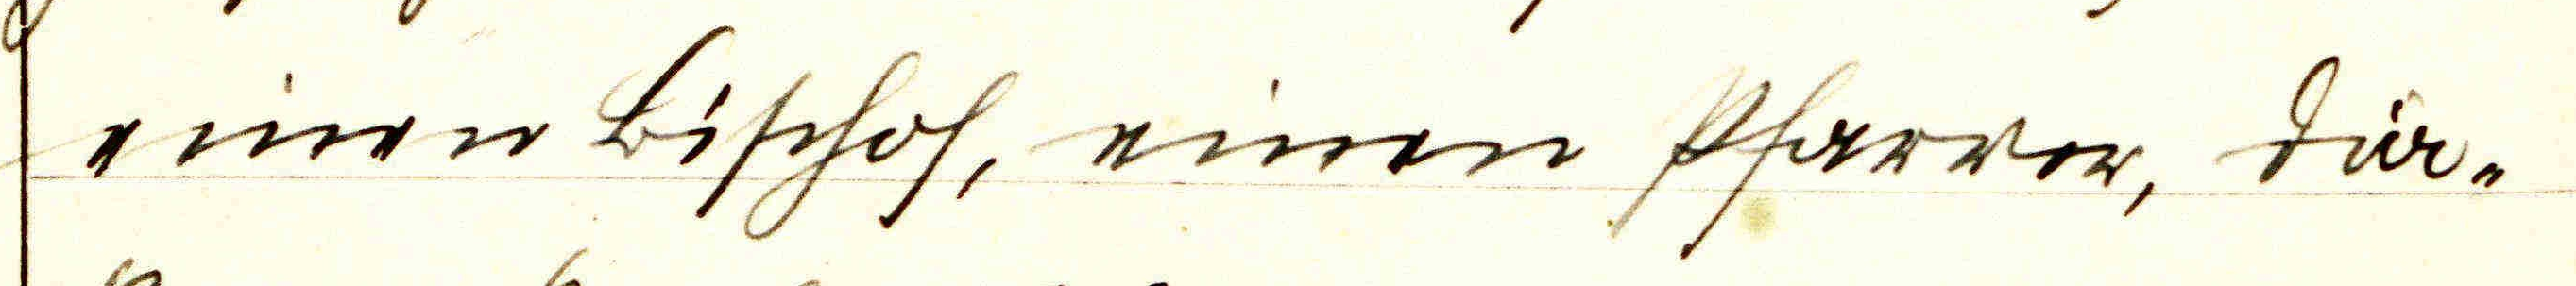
einen Bischof, einen Pfarrer, Dia-
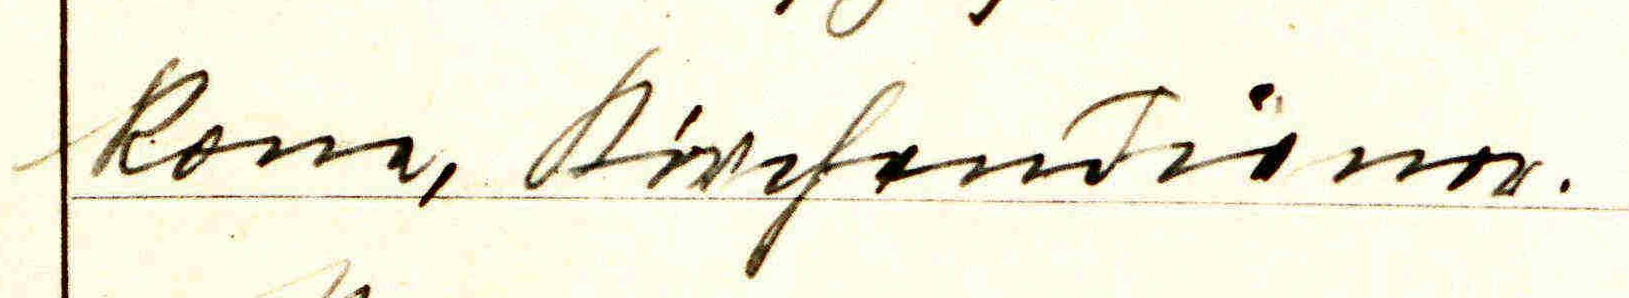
kone, Kirchendiener.
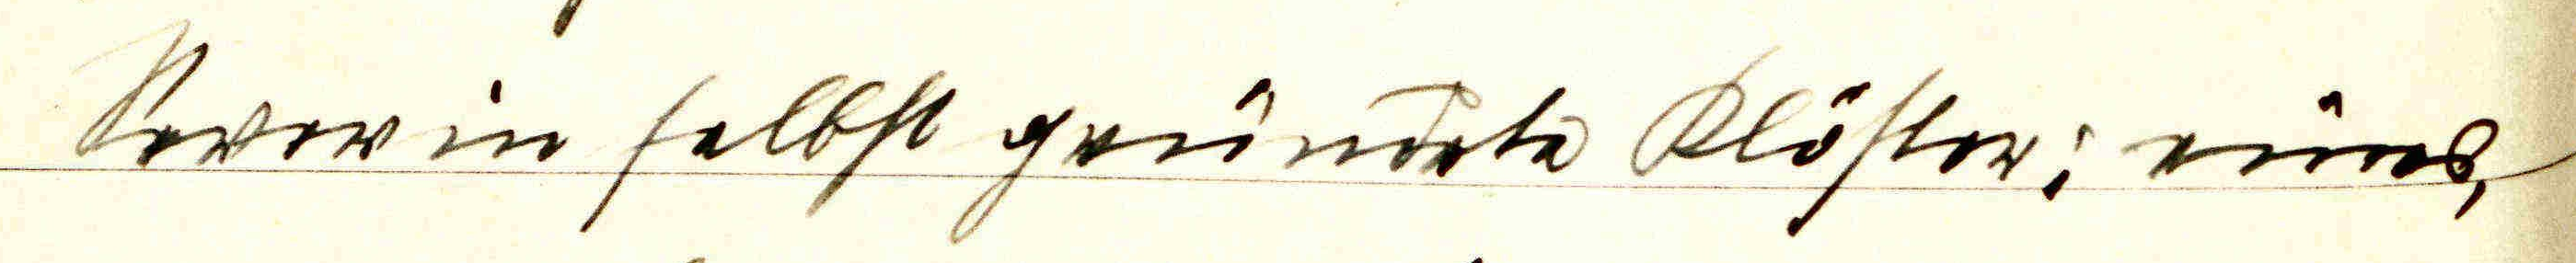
Severin selbst gründete Klöster; eines,
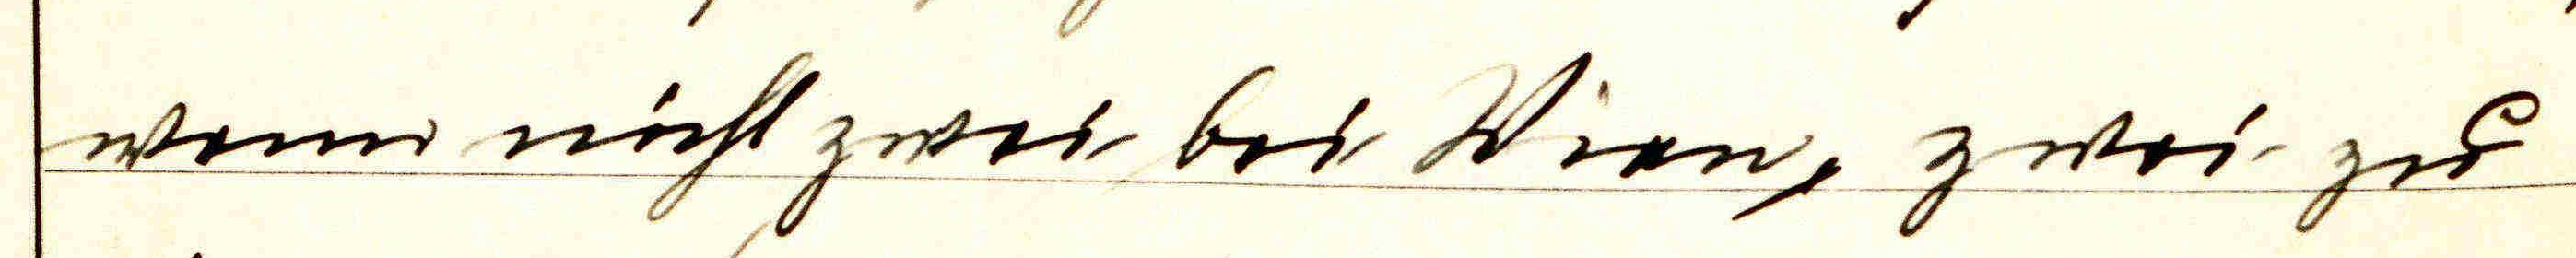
wenn nicht zwei bei Wien, zwei zu
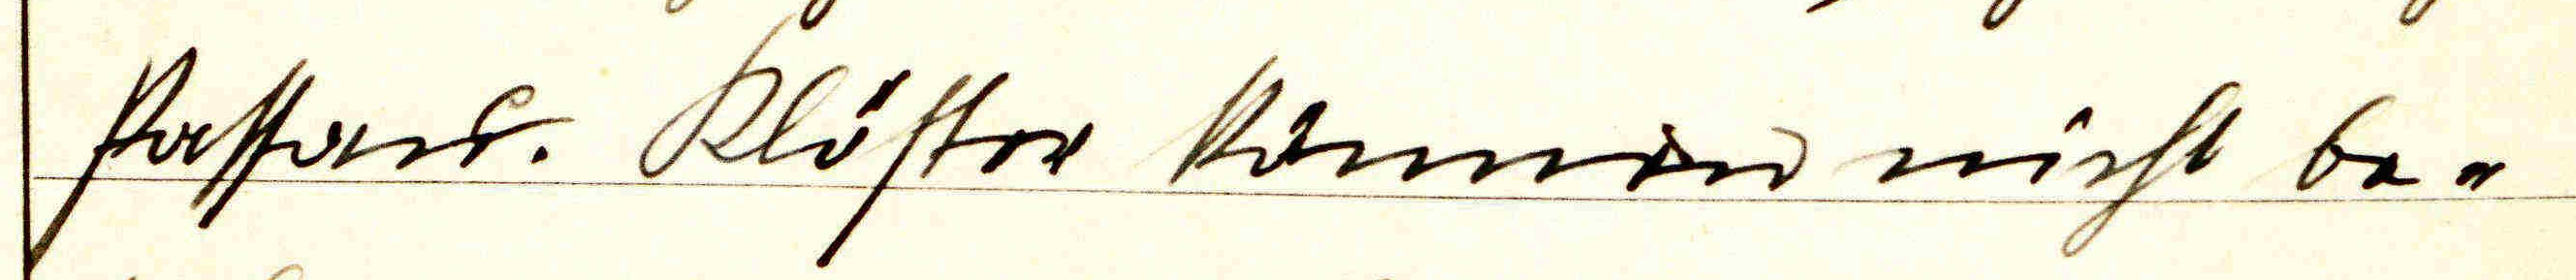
Passau. Klöster können nicht be-
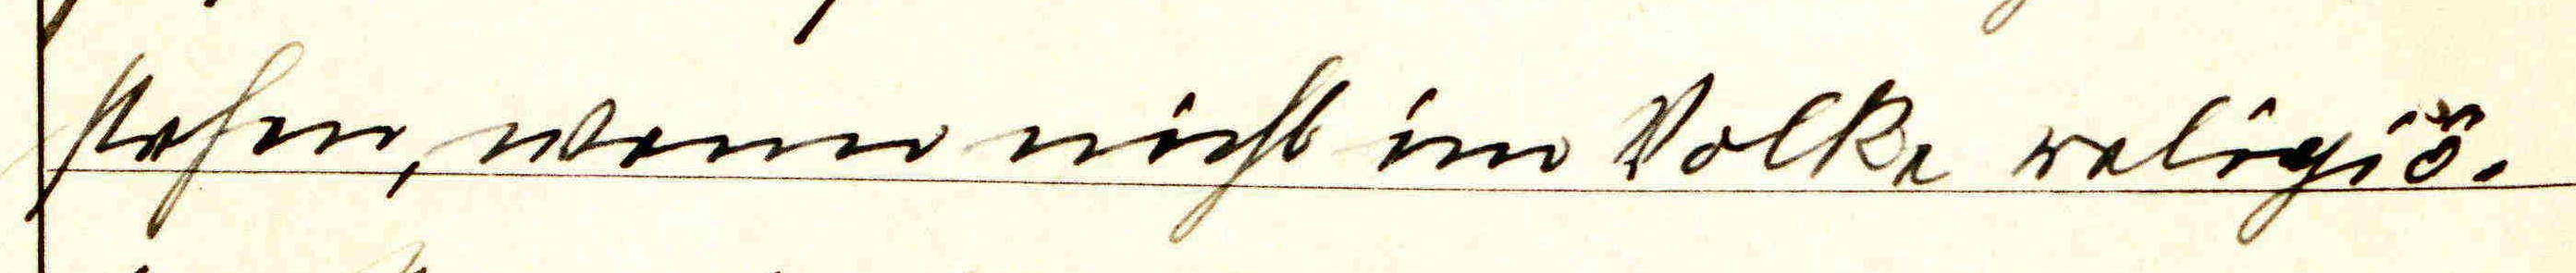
stehen, wenn nicht im Volke religiö-
